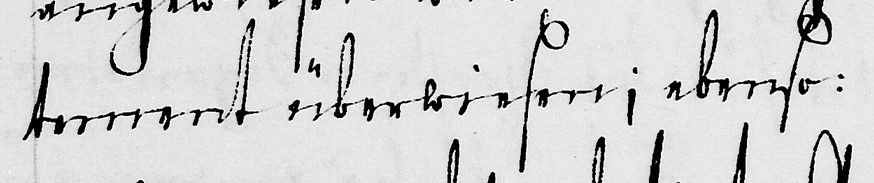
rtement überwiesen; ebenso:
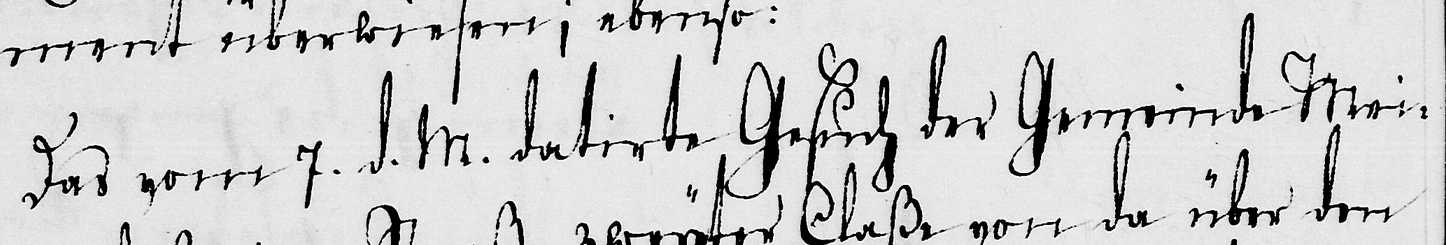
Das vom 7. d. M. datirte Gesuch der Gemeinde Mei¬
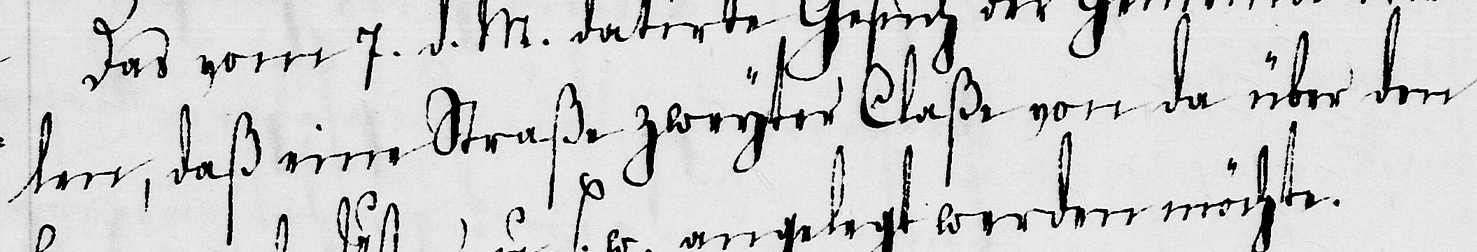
len, daß eine Straße zweyter Claße von da über den
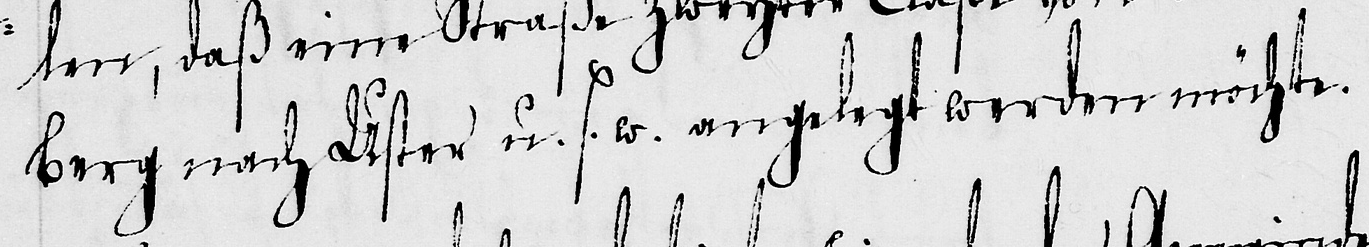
Berg nach Uster u.s.w. angelegt werden möchte.
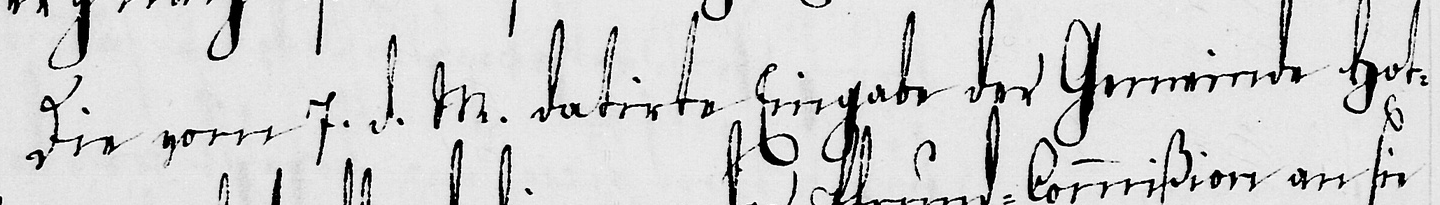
Die vom 7. d. M. datirte Eingabe der Gemeinde Hot¬
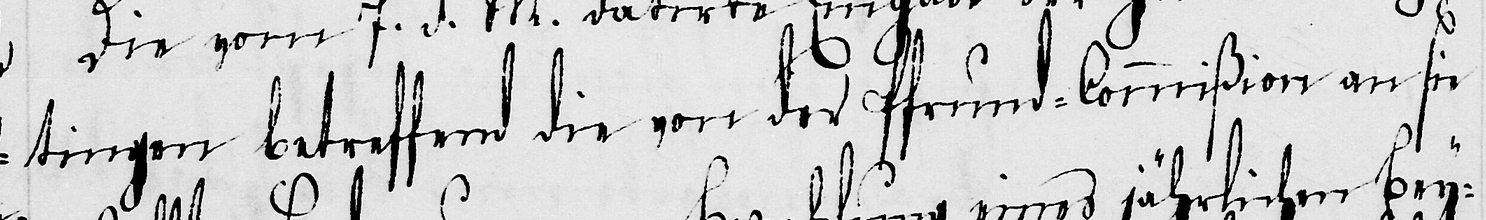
tingen betreffend die von der Pfrund-Commißion an sie
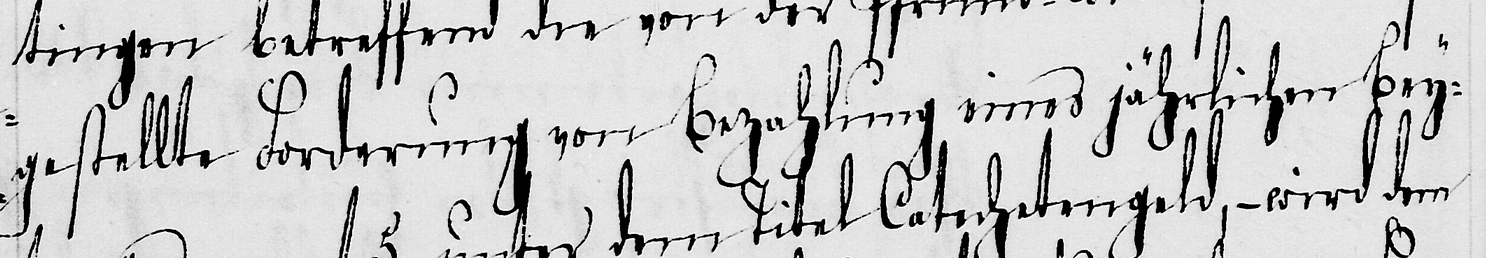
estellte Forderung von Bezahlung eines jährlichen Bey¬
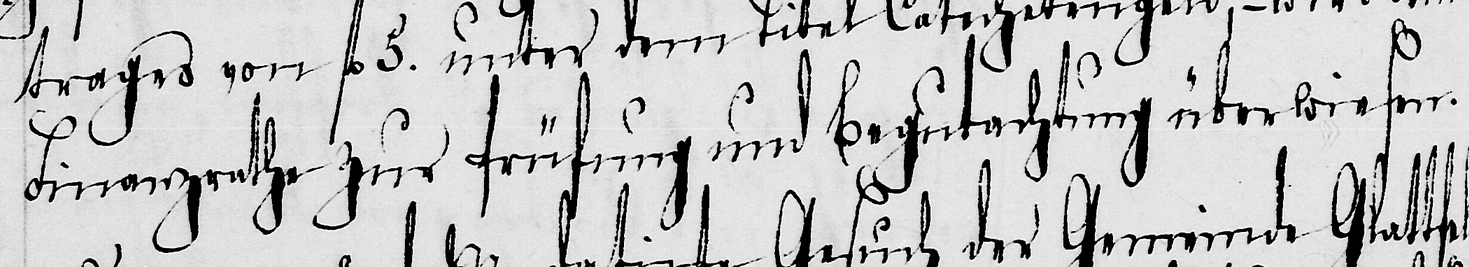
Finanzrathe zur Prüfung und Begutachtung überwiesen.
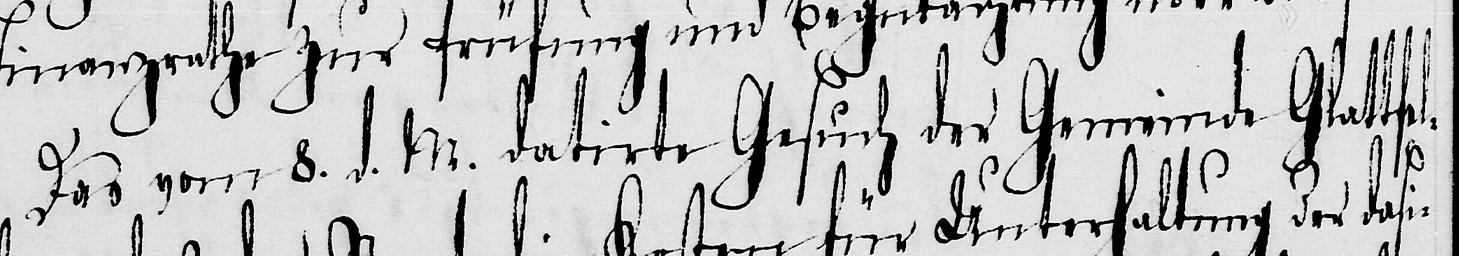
Das vom 8. d. M. datirte Gesuch der Gemeinde Glat¬
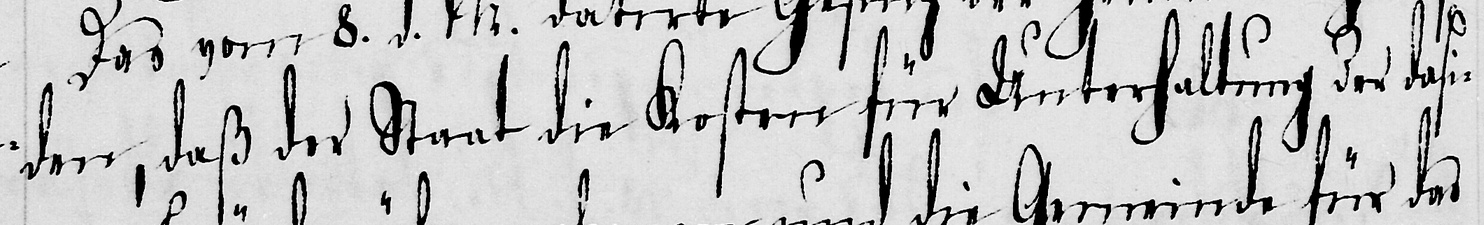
den, daß der Staat die Kosten für Unterhaltung der da¬
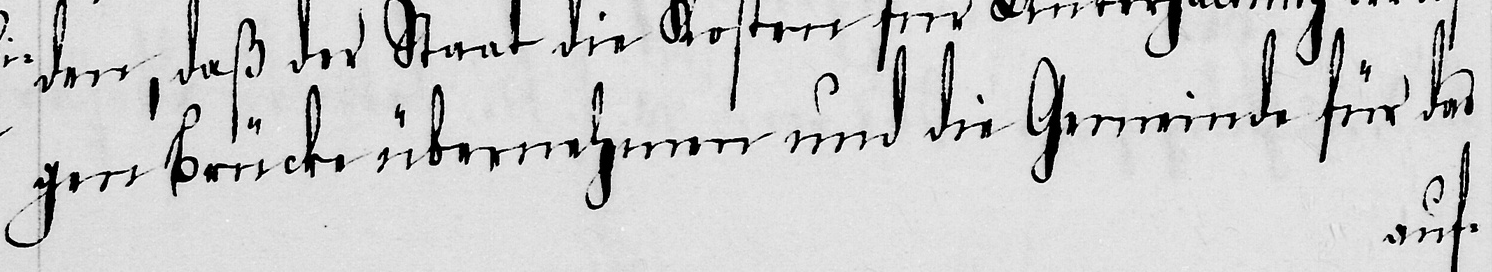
gen Brücke übernehmen und die Gemeinde für das
